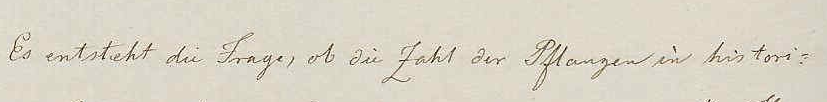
Es entsteht die Frage, ob die Zahl der Pflanzen in histori-
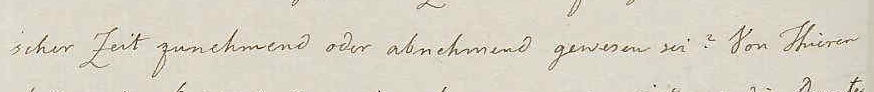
scher Zeit zunehmend oder abnehmend gewesen sei? Von Thieren
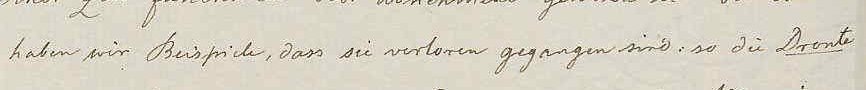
haben wir Beispiele, dass sie verloren gegangen sind: so die Dronte
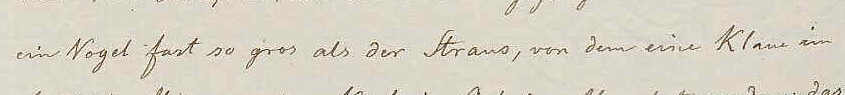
ein Vogel fast so gros als der Straus, von dem eine Klaue im
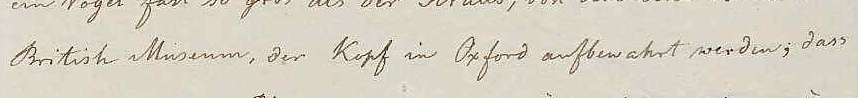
British Museum, der Kopf in Oxford aufbewahrt werden; dass
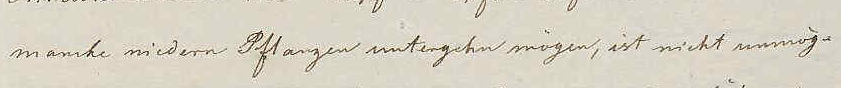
manche niedern Pflanzen untergehn mögen, ist nicht unmög-
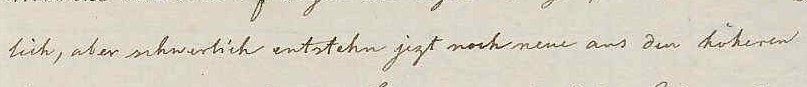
lich, aber schwerlich entstehn jezt noch neue aus den höheren
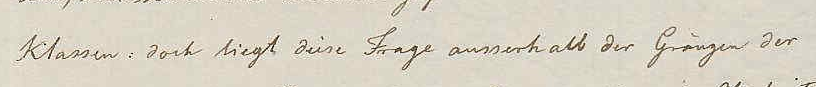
Klassen: doch liegt diese Frage ausserhalb der Gränzen der
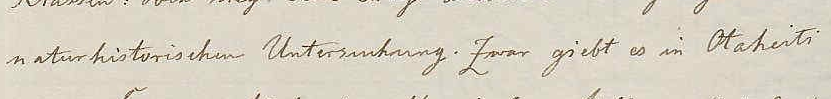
naturhistorischen Untersuchung. Zwar giebt es in Otaheiti
